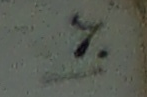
7.
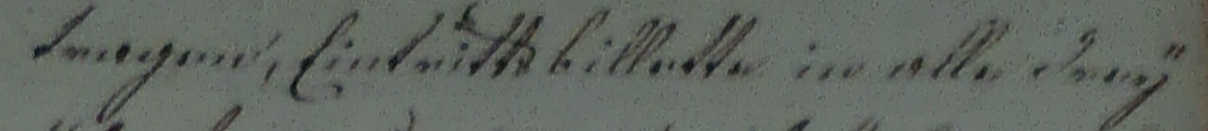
tragen, Eintrittsbillette in alle drey
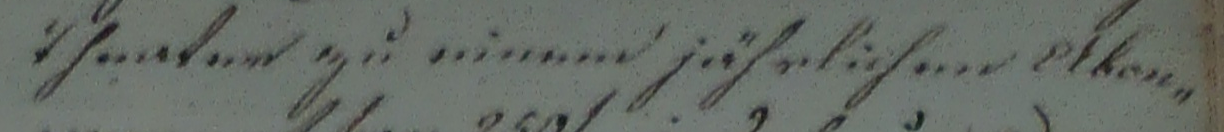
Theater zu einem jährlichen Abon¬
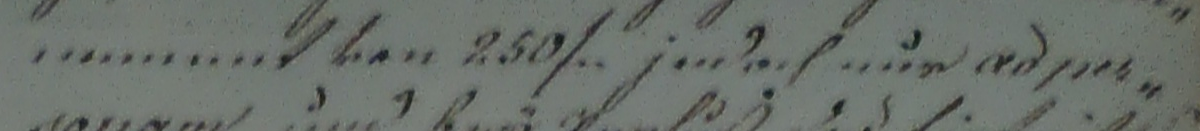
nement von 250 fn jedoch nur ad per¬
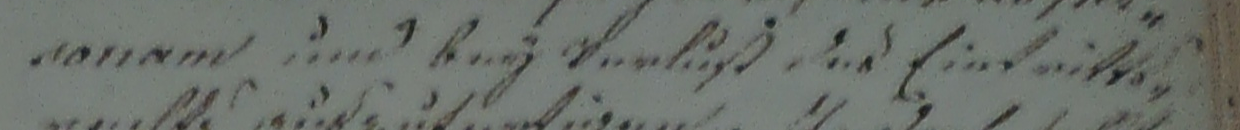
sonam und bey Verlust des Eintritts¬
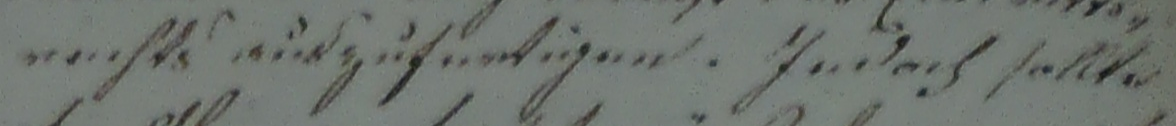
rechts auszufertigen. Jedoch sollte
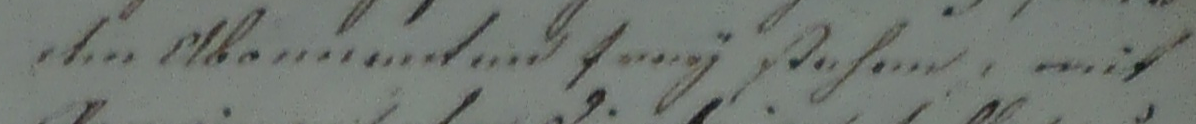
den Abonnenten frey stehen, mit
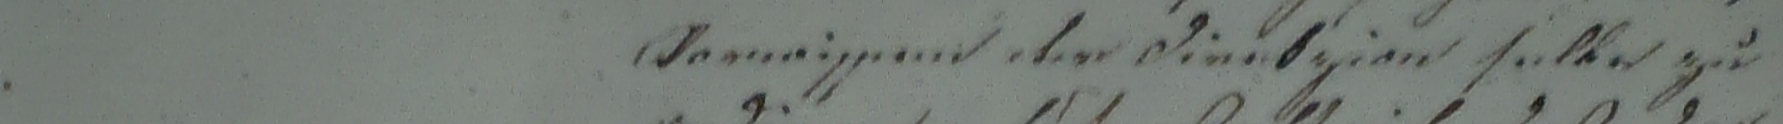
Vorwissen der Direkzion selbe zu
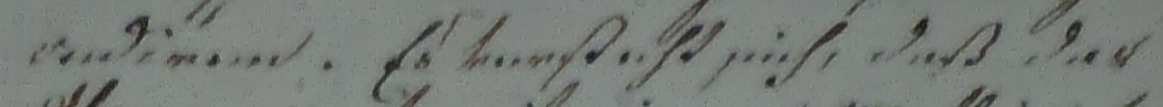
sediren. Es versteht sich, daß der
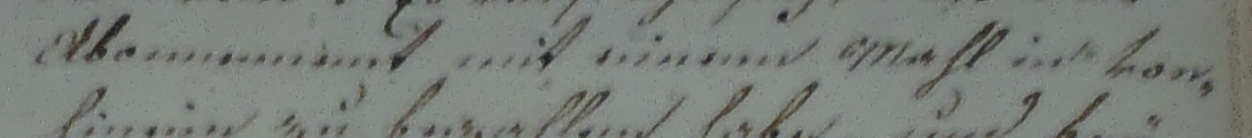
Abonnent mit einem Mahl in vor¬
